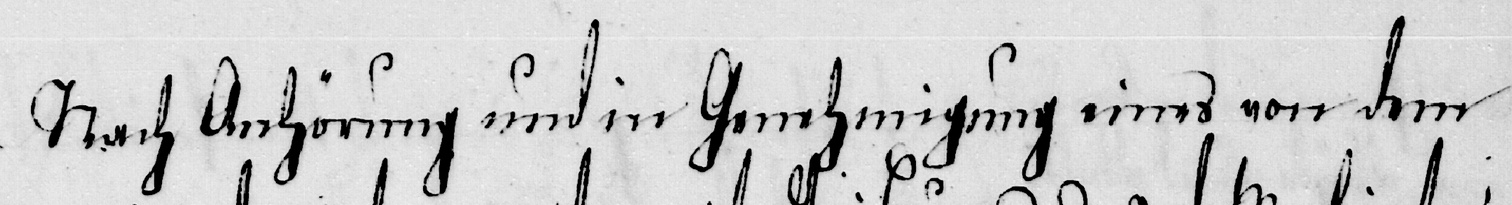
Nach Anhörung und in Genehmigung eines von dem
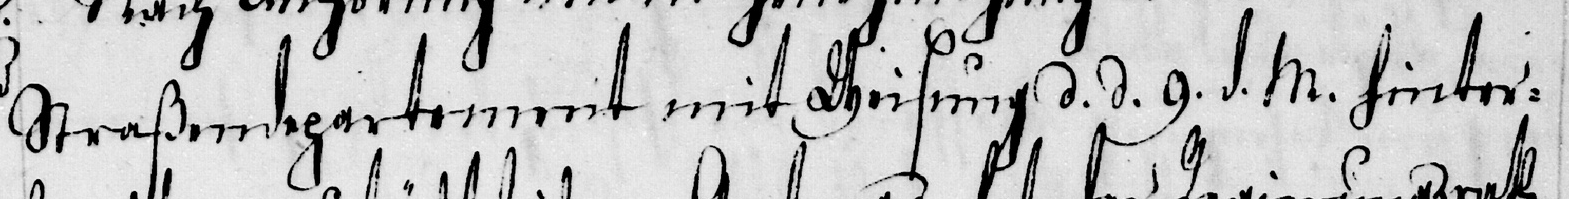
Straßendepartement mit Weisung d. d. 9. d. M. hinter¬
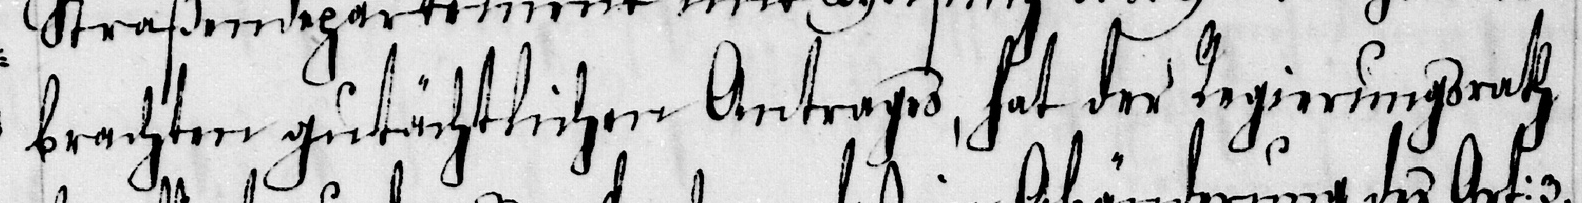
brachten gutächtlichen Antrages, hat der Regierungsrath
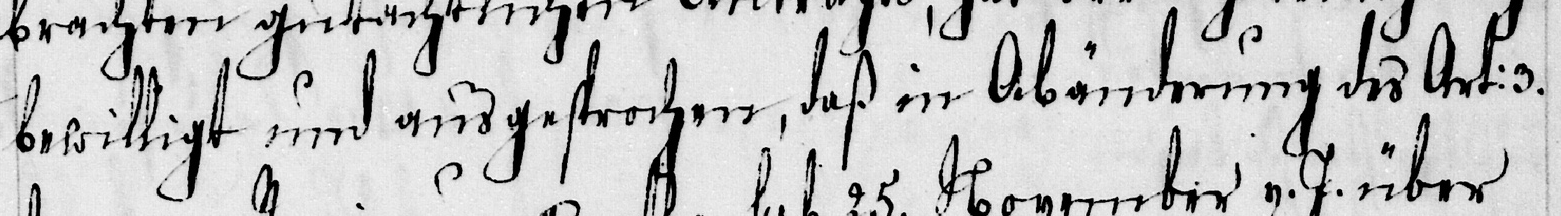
bewilligt und ausgesprochen, daß in Abänderung des Art: 3.
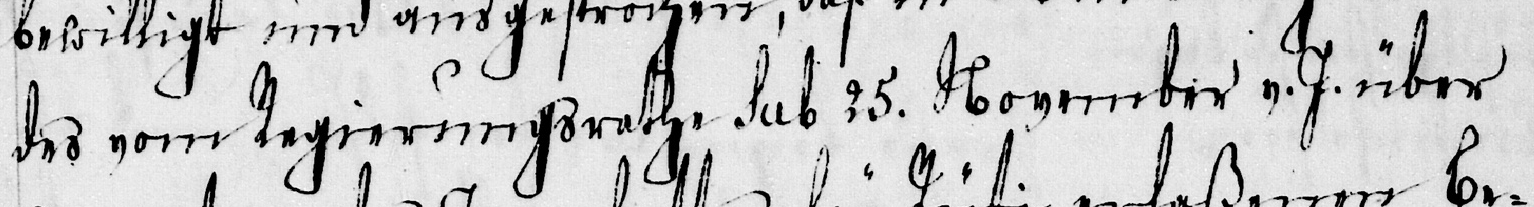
des vom Regierungsrathe sub 25. November v. J. über
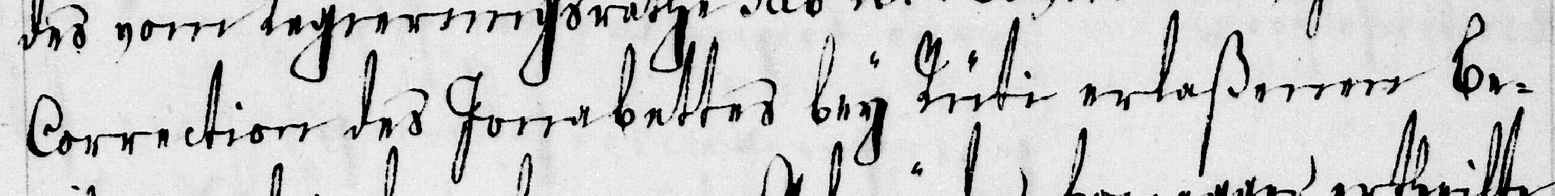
Correction des Jonabettes bey Rüti erlaßenen Be¬
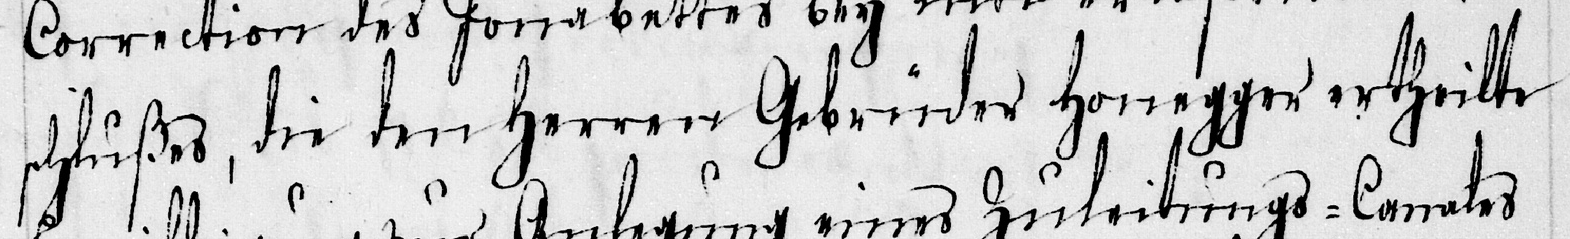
schlußes, die den Herren Gebrüder Honegger ertheilte
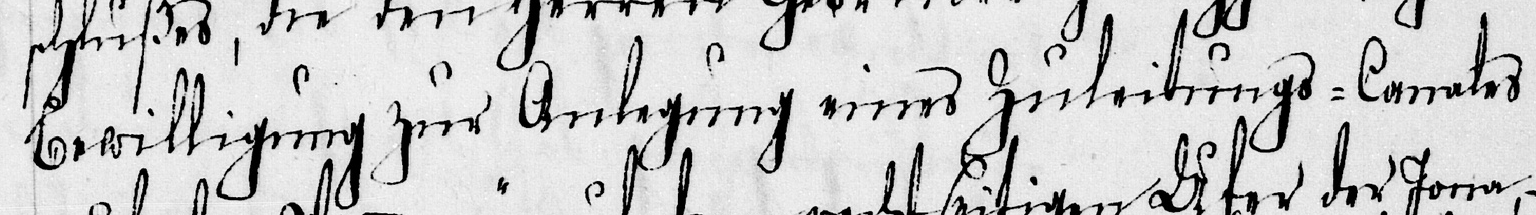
Bewilligung zur Anlegung eines Zuleitungs-Canales
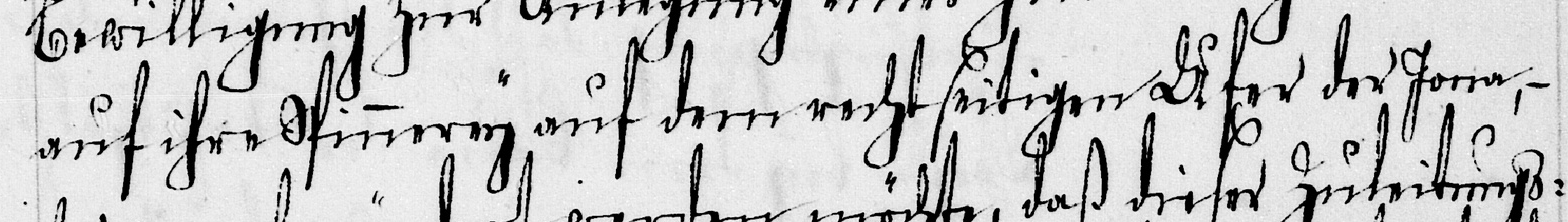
auf ihre Spinnerey auf dem rechtseitigen Ufer der Jona,
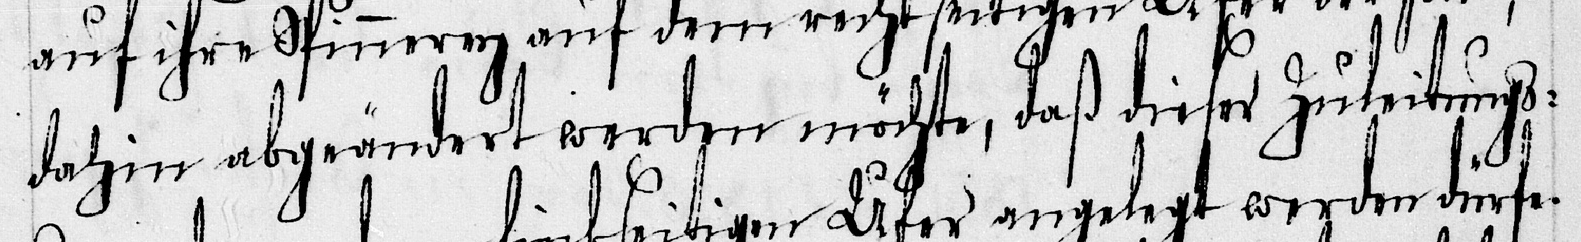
dahin abgeändert werden möchte, daß dieser Zuleitung¬
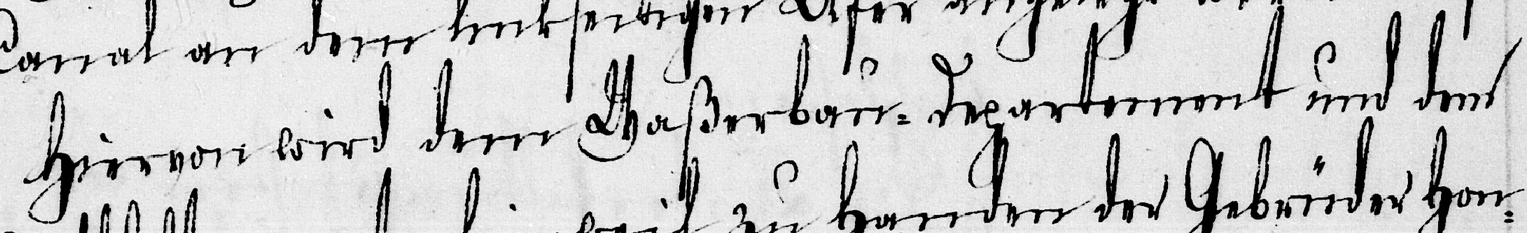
Hiervon wird dem Waßerbau-Departement und dem
